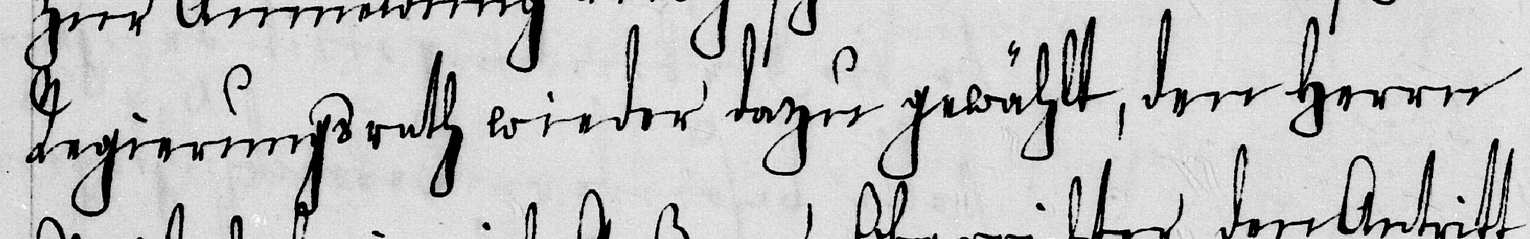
Regierungsrath wieder dazu gewählt, den Herrn
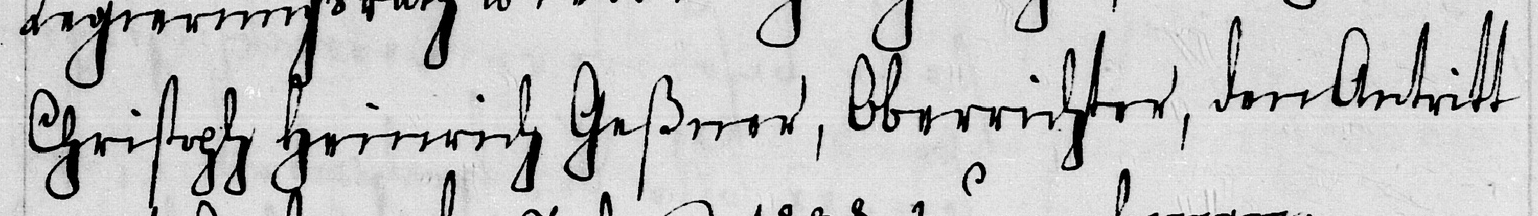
Christoph Heinrich Geßner, Oberrichter, den Antritt
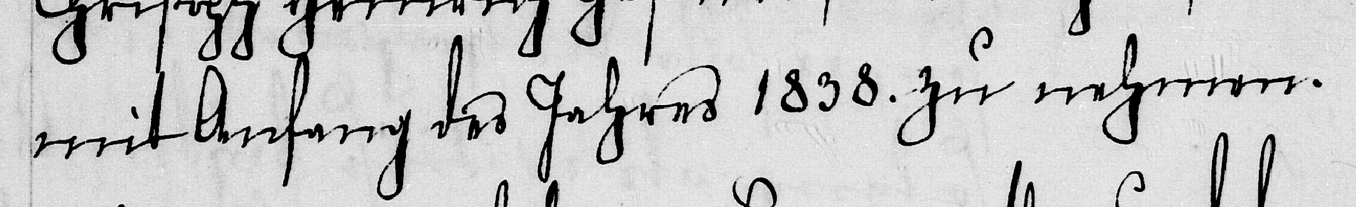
mit Anfang des Jahres 1838. zu nehmen.
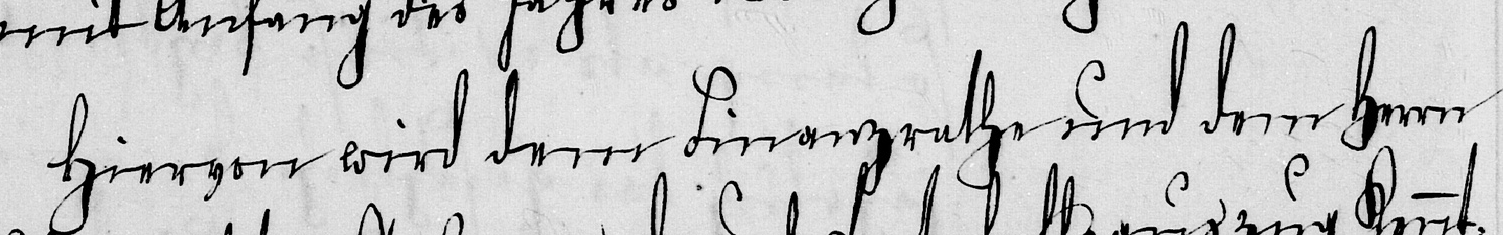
Hiervon wird dem Finanzrathe und dem Herrn
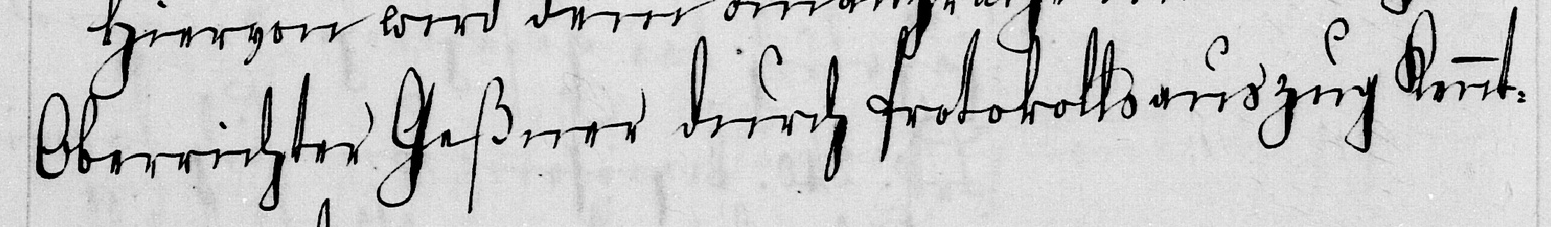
Oberrichter Geßner durch Protokollsauszug Kennt¬
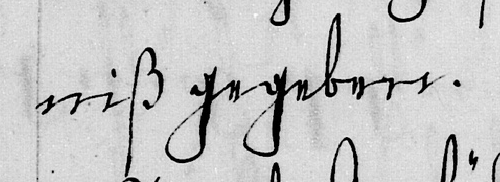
niß gegeben.
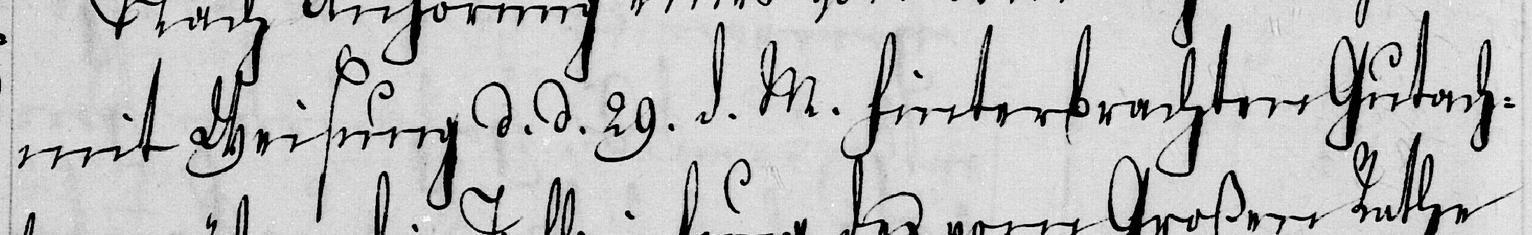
mit Weisung d. d. 29. d. M. hinterbrachten Gutach¬
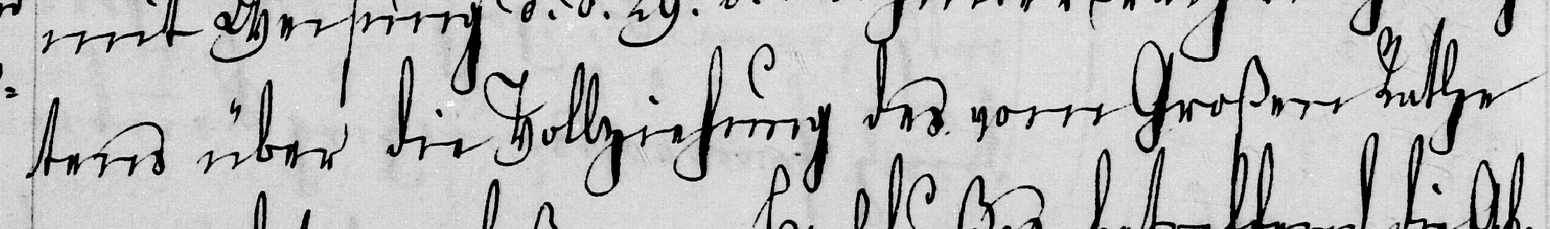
tens über die Vollziehung des vom Großen Rathe
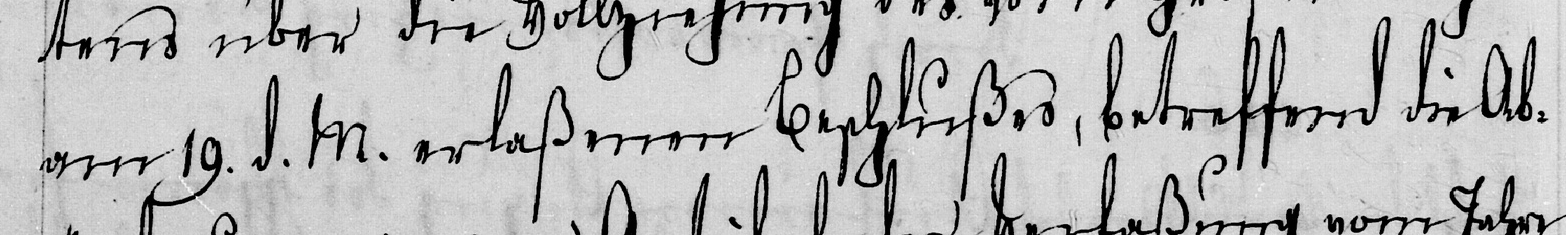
am 19. d. M. erlaßenen Beschlußes, betreffend die A¬
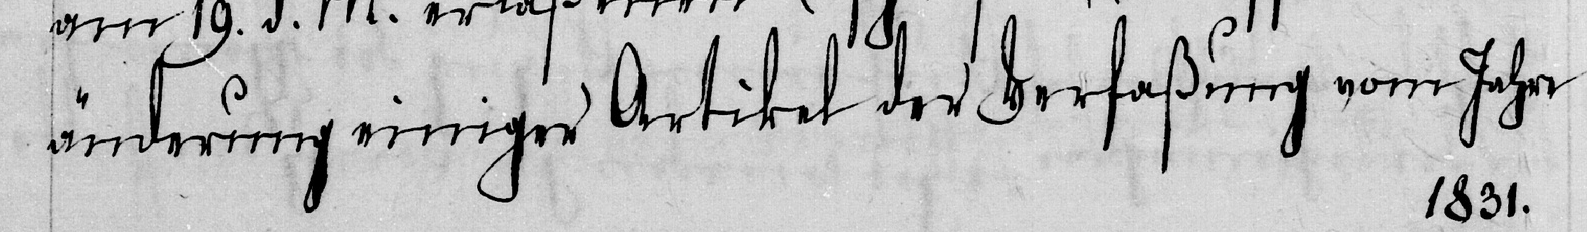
bänderung einiger Artikel der Verfaßung vom Jahre
